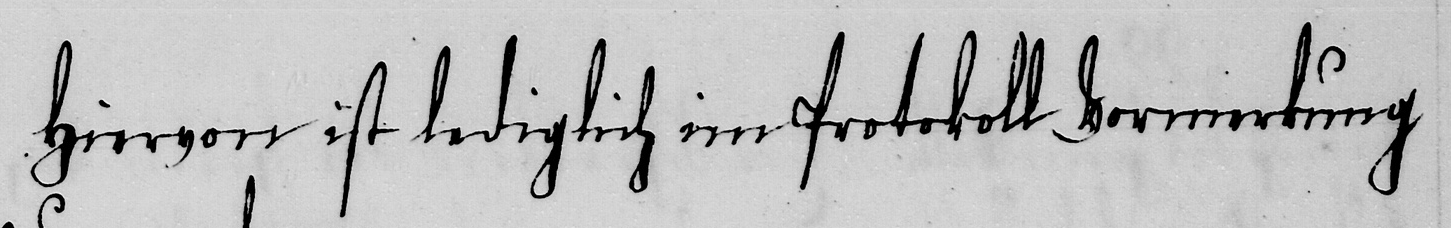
Hiervon ist lediglich im Protokoll Vormerkung
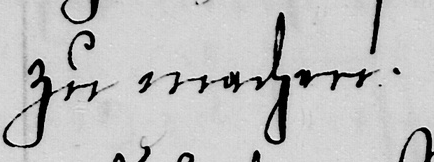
zu machen.
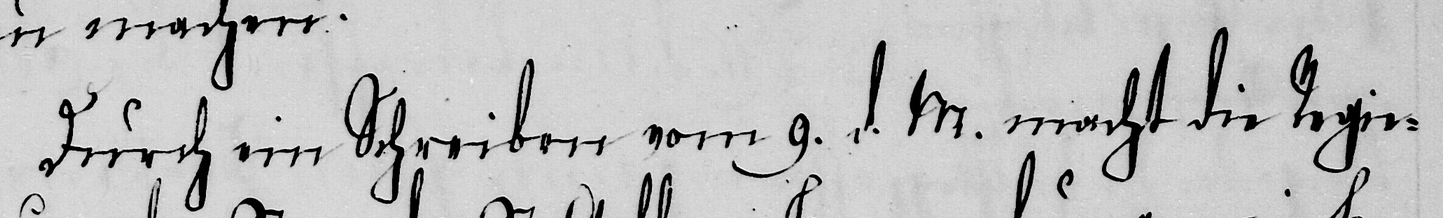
Durch ein Schreiben vom 9. d. M. macht die Regie¬
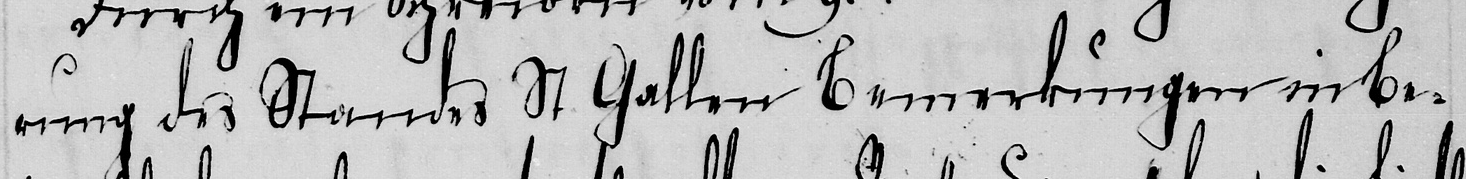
rung des Standes St. Gallen Bemerkungen in Be¬
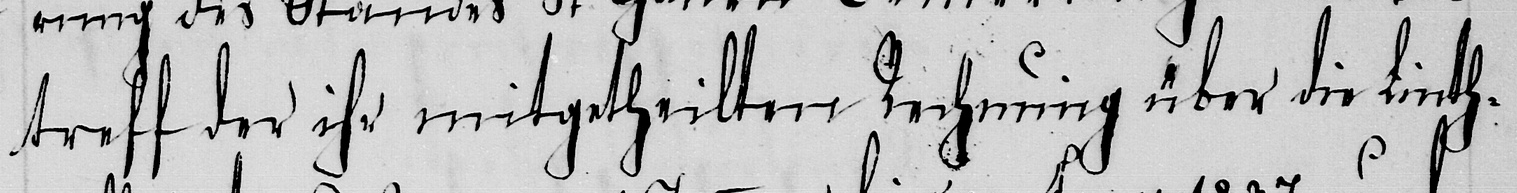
treff der ihr mitgetheilten Rechnung über die Lint¬
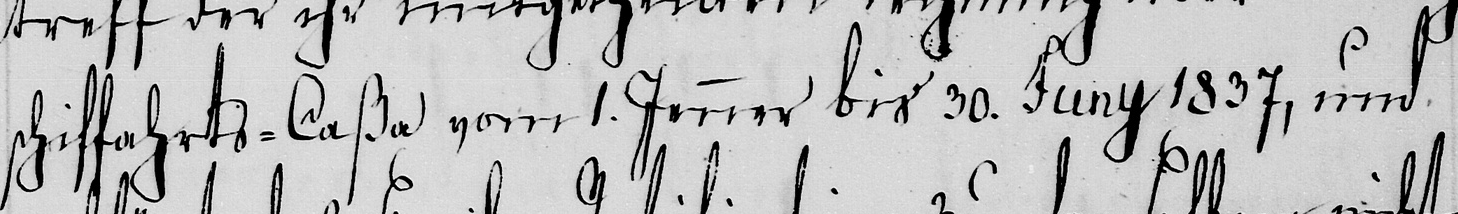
chiffahrts-Caßa vom 1. Jenner bis 30. Juny 1837, und
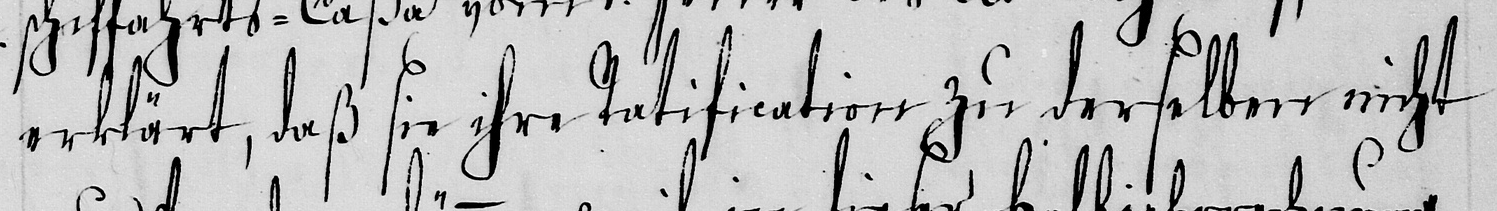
erklärt, daß sie ihre Ratification zu derselben nicht
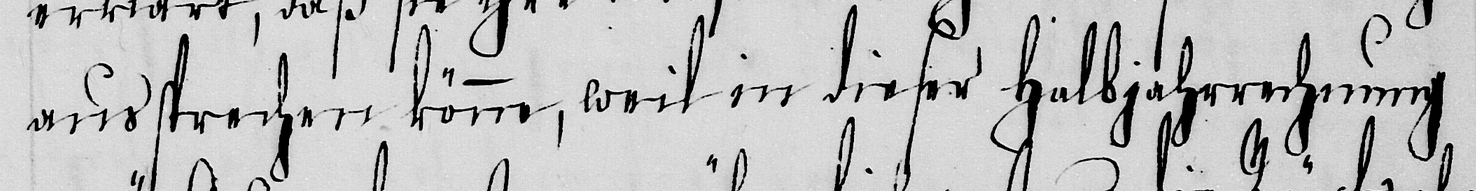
aussprechen könne, weil in dieser Halbjahresrechnung
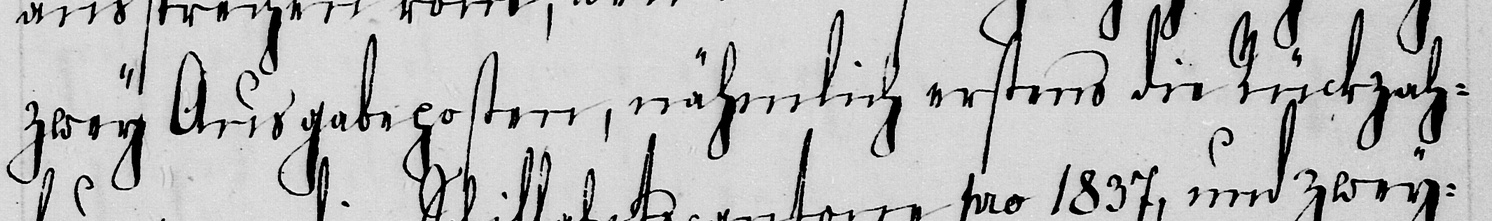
zwey Ausgabeposten, nähmlich erstens die Rückzah¬
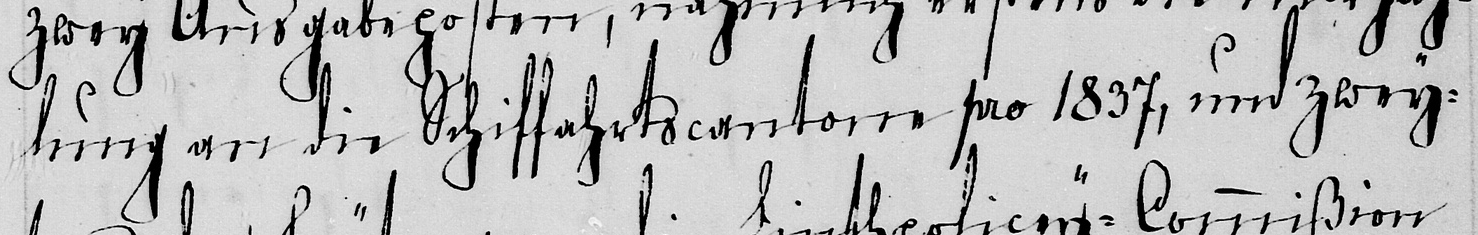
lung an die Schiffahrtscantone pro 1837, und zwey¬
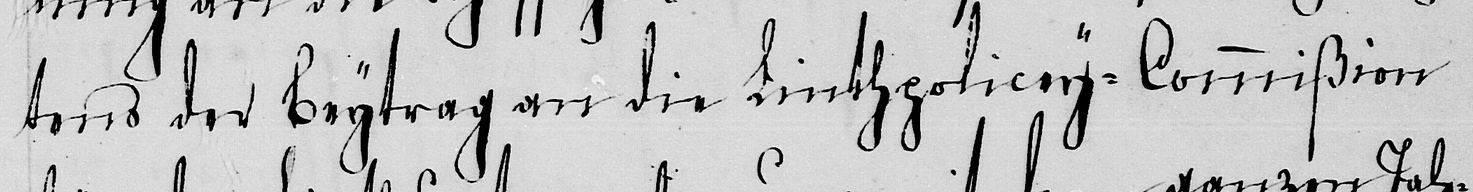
tens der Beytrag an die Linthpolicey-Commißion
